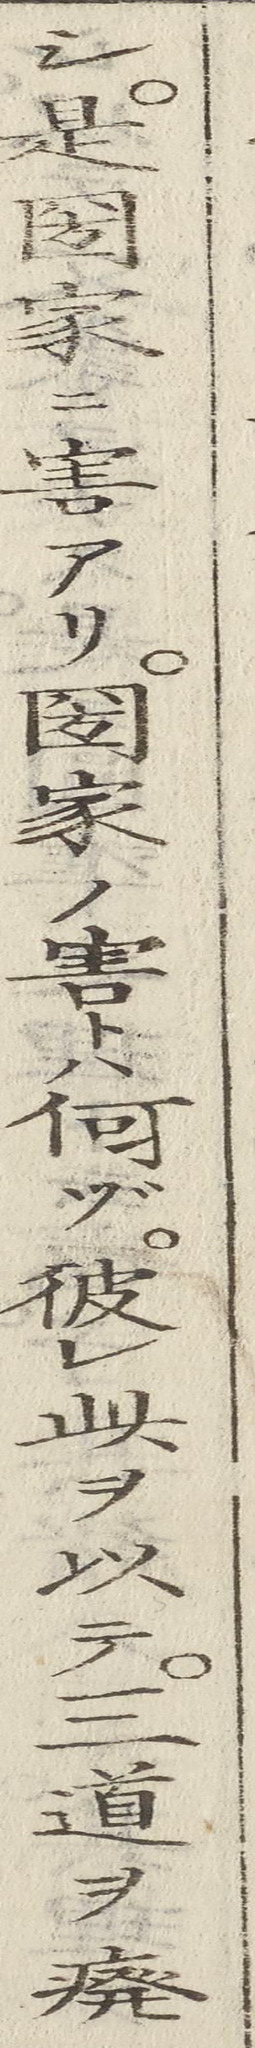シ。是国家ニ害アリ。国家ノ害トハ何ゾ。彼レ此ヲ以テ。三道ヲ廃
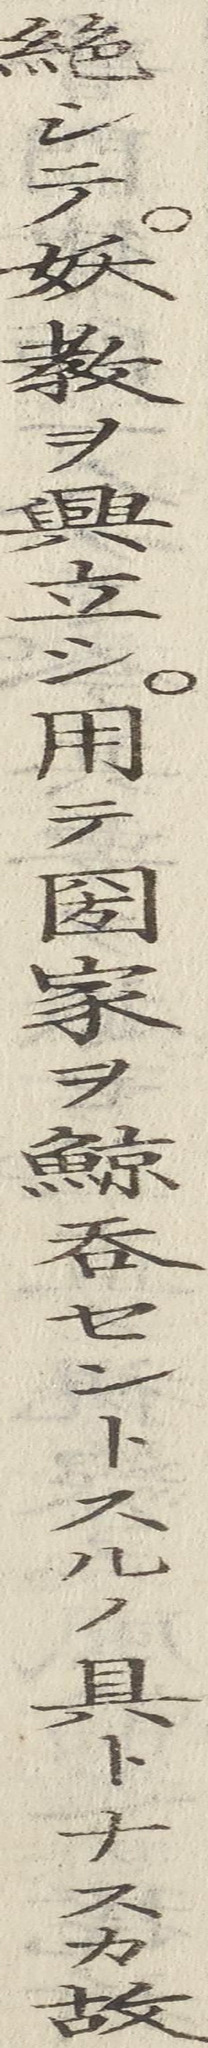絶シテ。妖教ヲ興立シ。用テ国家ヲ鯨呑セントスルノ具トナスカ故
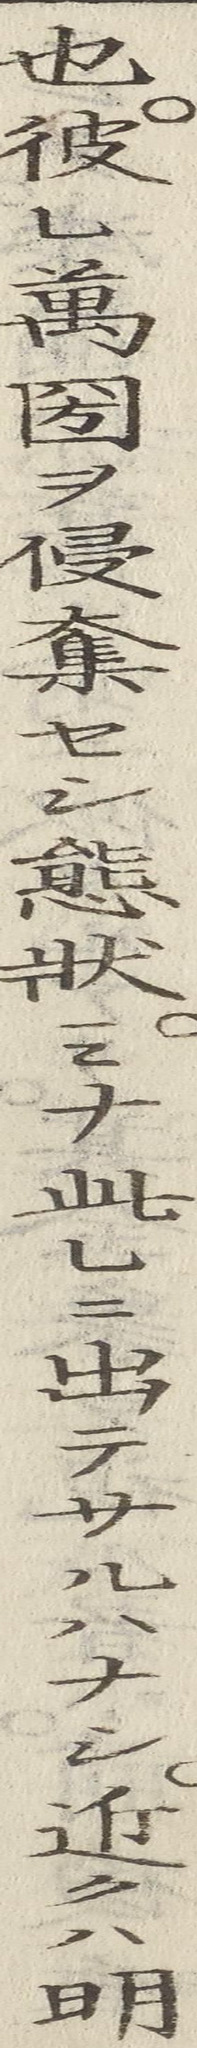也。彼レ万国ヲ侵奪セシ態状。ミナ此レニ出テサルハナシ。近クハ明
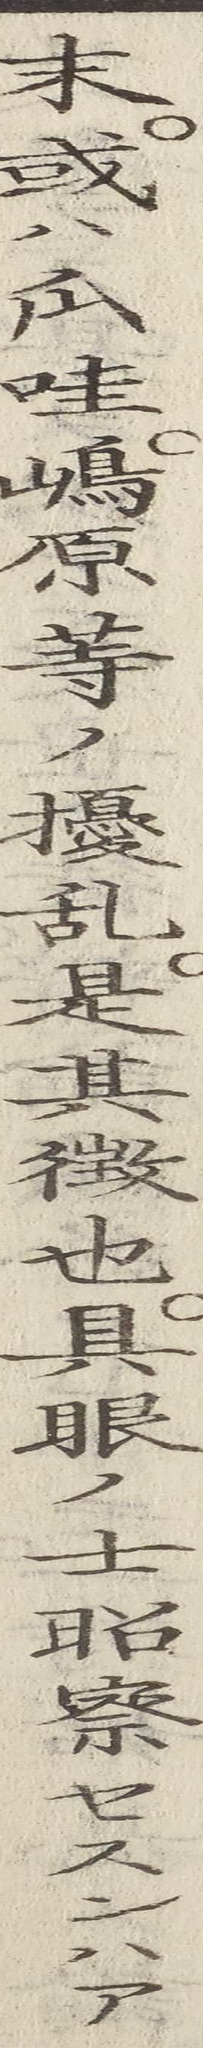末。或ハ布哇。島原等ノ擾乱。是其徴也。具眼ノ士昭察セスンハア

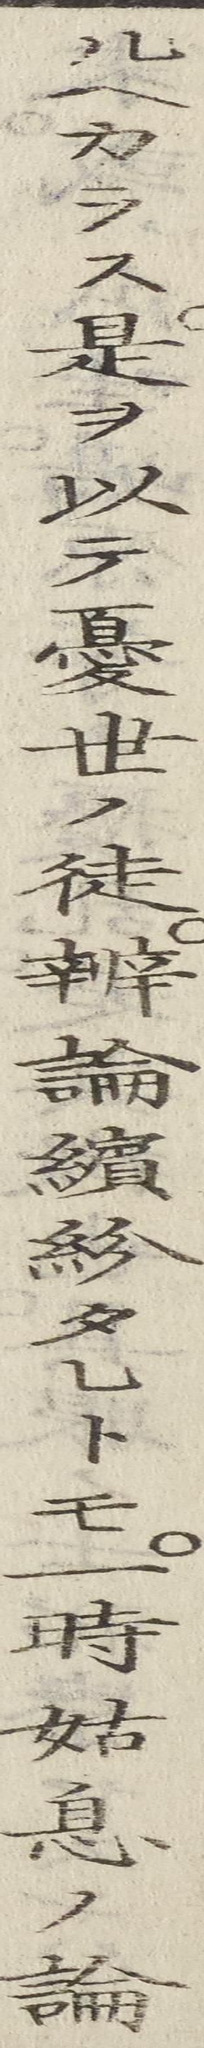ルヘカラス。是ヲ以テ憂世ノ徒。弁論繽紛タレトモ。一時姑息ノ論
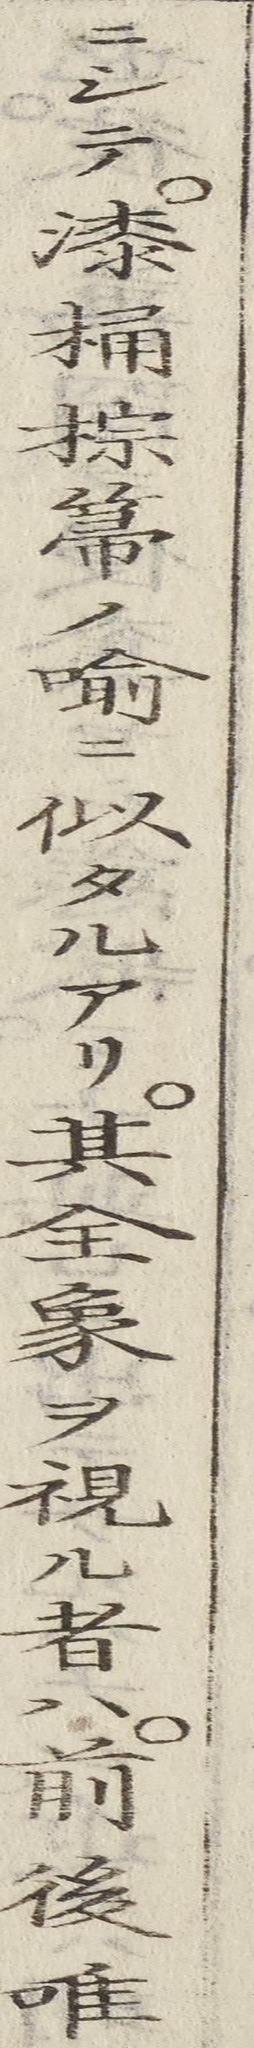ニシテ。漆桶棕箒ノ喩ニ似タルアリ。其全象ヲ視ル者ハ。前後唯
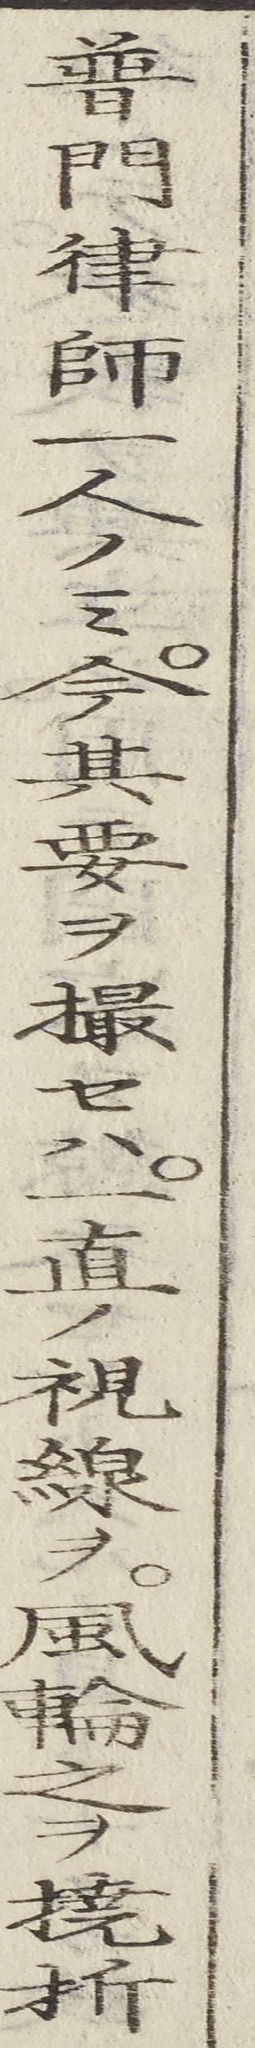普門律師一人ノミ。今其要ヲ撮セハ。一直ノ視線ヲ。風輪之ヲ撓折
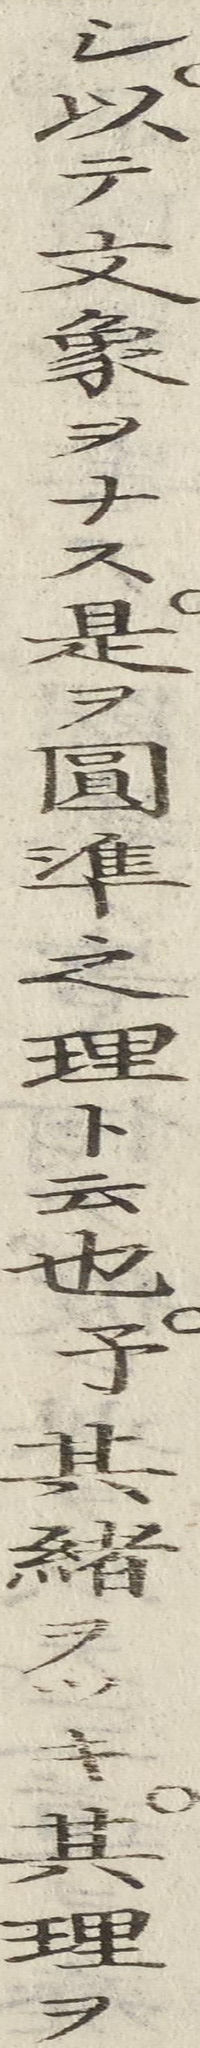シ以テ。文象ヲナス。是ヲ円準之理ト云也。予其緒ヲツキ。其理ヲ
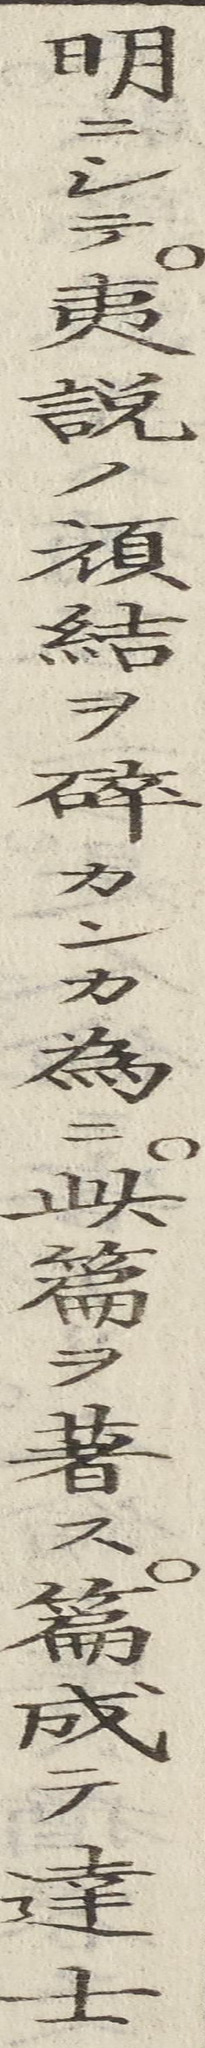明ニシテ。夷説ノ項結ヲ砕カンカ為ニ。此篇ヲ著ス。篇成テ達士
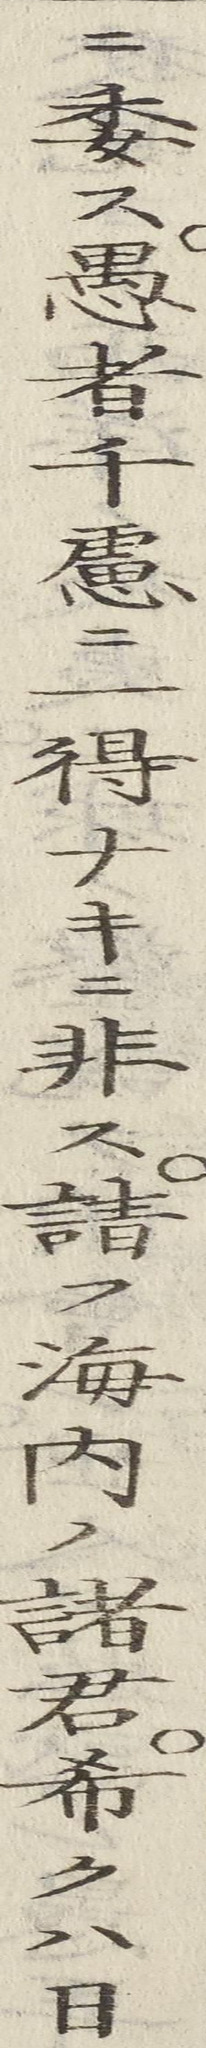ニ委ス。愚者千慮ニ一得ナキニ非ス。請フ海内ノ諸君。希クハ日
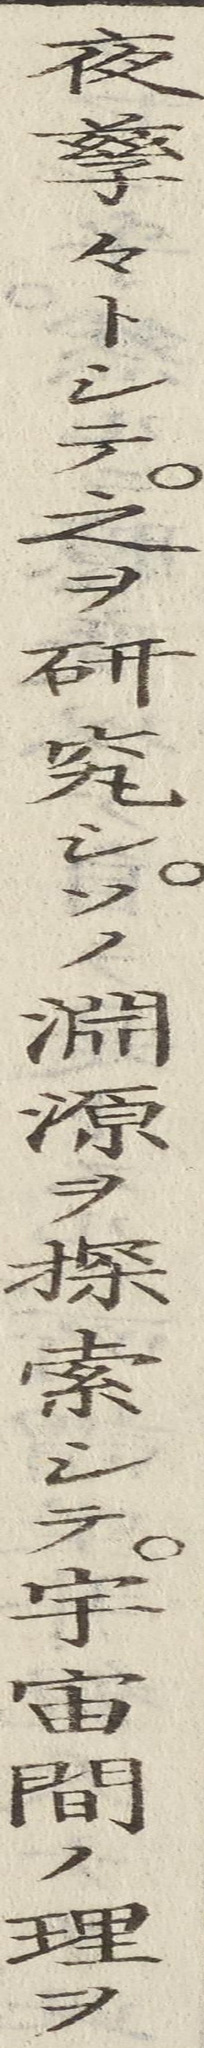夜孳々トシテ。之ヲ研究シ。ソノ淵源ヲ探索シテ。宇宙間ノ理ヲ
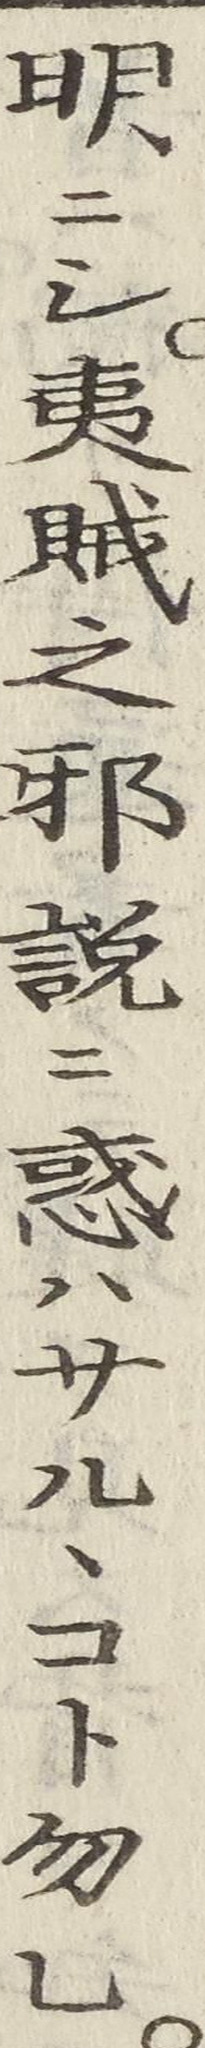明ニシ。夷賊之邪説ニ惑ハサルヽコト勿レ。
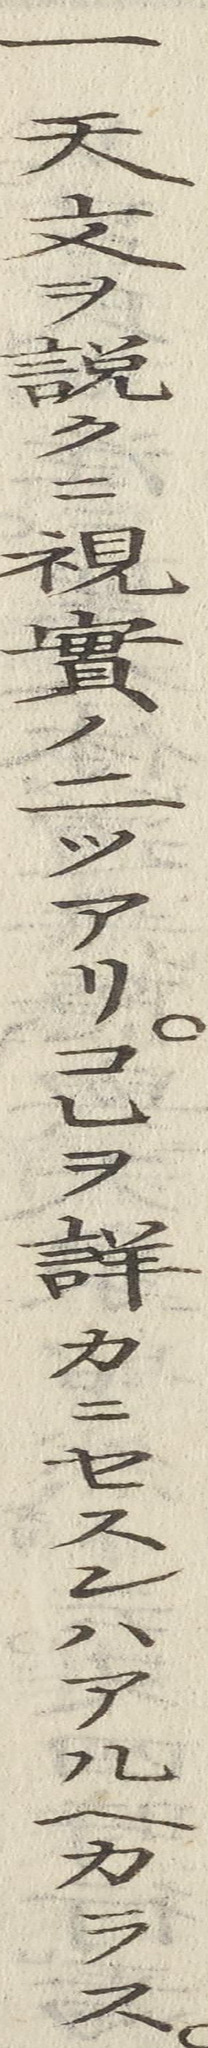一天文ヲ説クニ視実ノ二ツアリ。コレヲ詳カニセスンハアルへカラス。
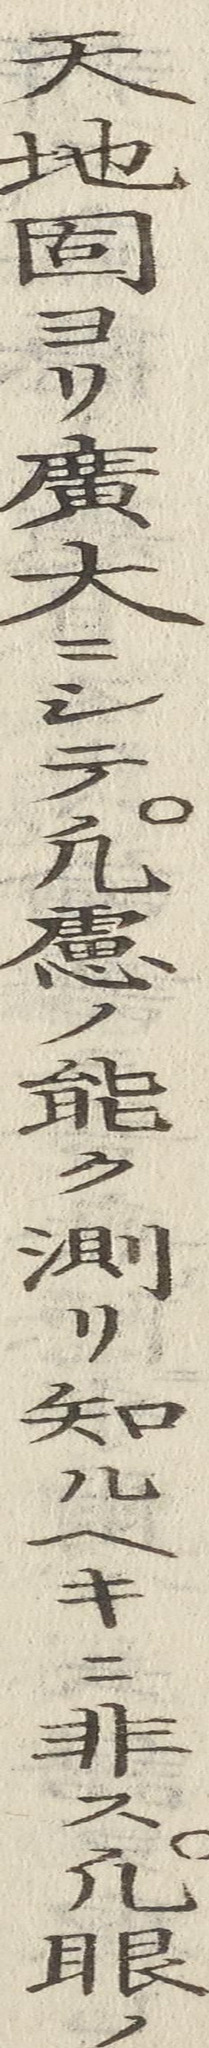天地固ヨリ広大ニシテ。凡慮ノ能ク測リ知ルヘキニ非ス。凡眼ノ
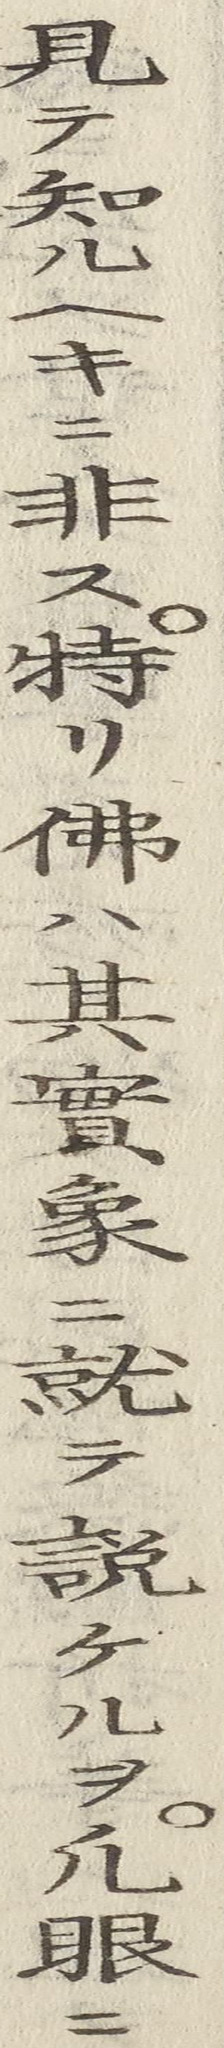見テ知ルへキニ非ス。特リ佛ハ其実象ニ就テ説ケルヲ。凡眼ニ
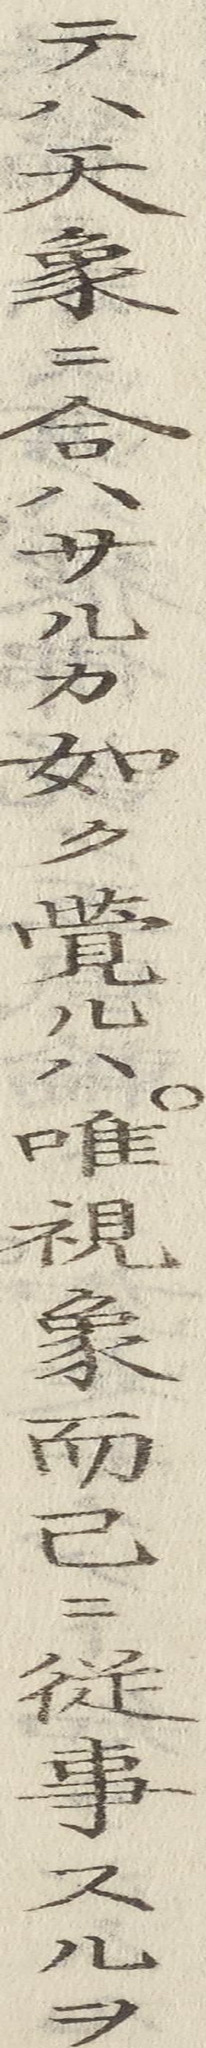テハ天象ニ合ハサルカ如ク覚ルハ。唯視象而己ニ従事スルヲ
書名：護法新論　上
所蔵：東京大学地震研究所図書室 Earthquake Research Institute Library, The University of Tokyo, JAPAN
